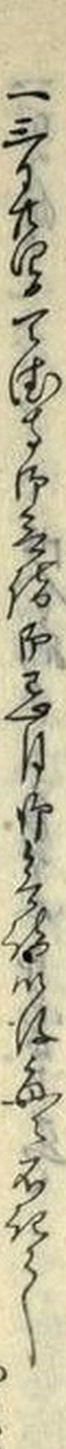一三月廿四日天徳寺御参詣御忌月御参詣以後毎々不記之
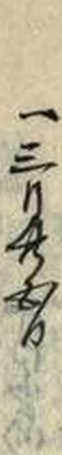一三月十五日
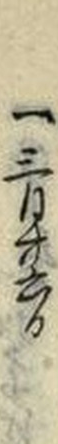一三月十五日
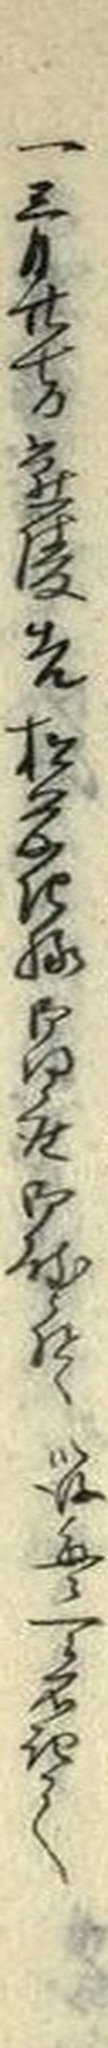一三月廿七日燕凌出ル松栄院様御同座御咄被遊候以後毎々一々不記之
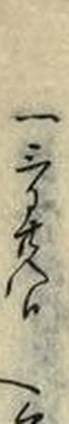一三月十五日
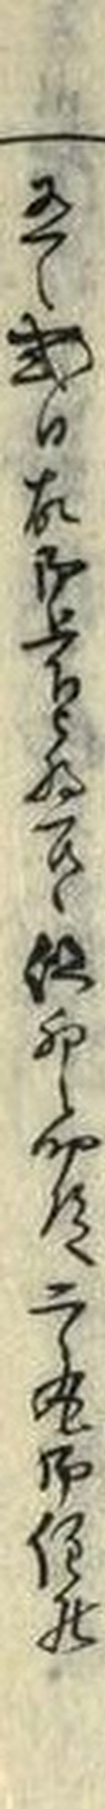有之式日故御上下被為召候但卯之助殿二之丸御住居
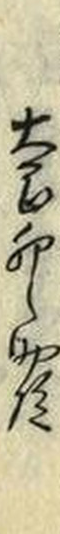大岡卯之助殿
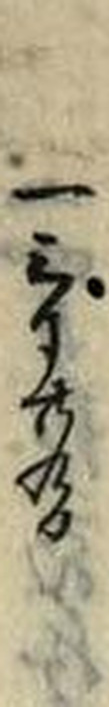一三月十五日

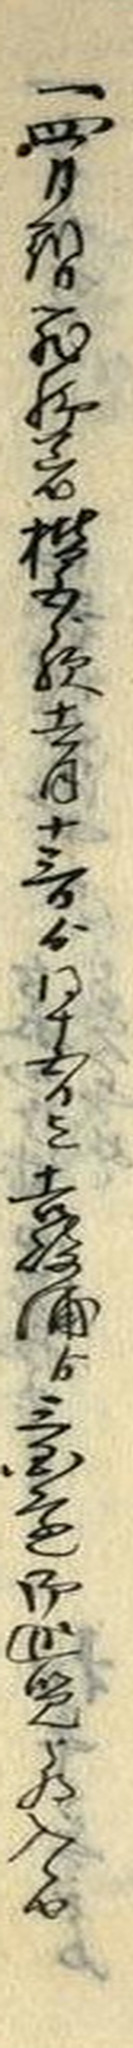一四月朔日飛脚着楷五郎様去月十三日ゟ同十五日迄吉崎浦ゟ三国辺御巡覧被為入候由
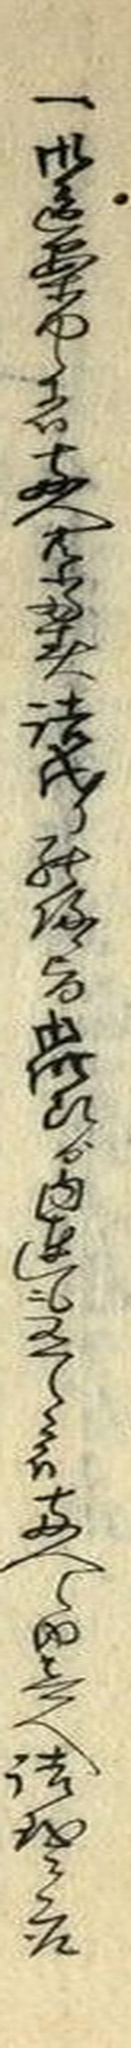一御道案内之者両人共当春詰代り罷帰候旨御供頭ゟ内達も有之ニ付両人之内壱人詰越ニ取
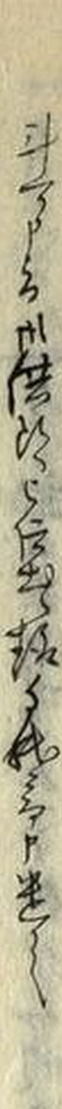計可申旨御供頭へ被仰出候趣手紙ニ而申遣之
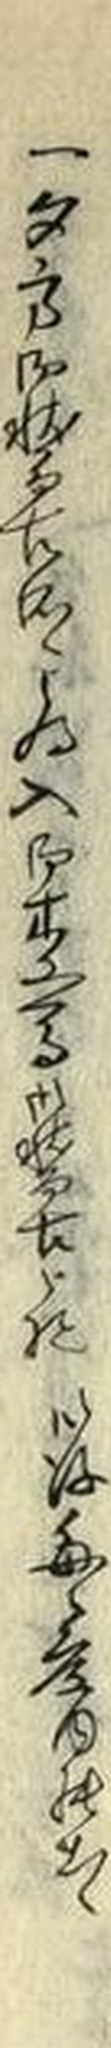一夕方御稽古所へ被為入御乗馬御稽古被遊以後毎々藤内罷出候
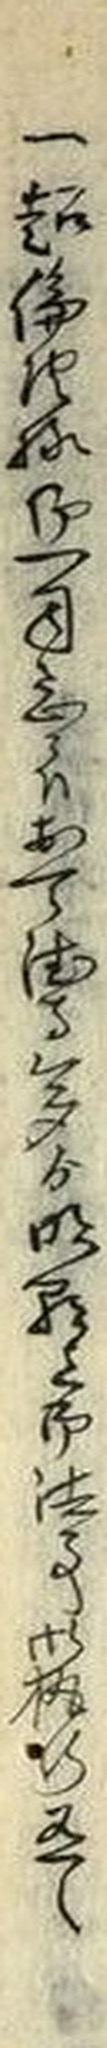一超倫院様御一周忌ニ付於天徳寺今夕ゟ明朝迄御法事御執行有之
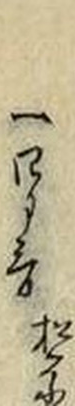一四月三日
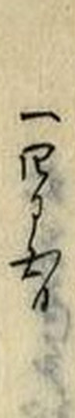一四月三日
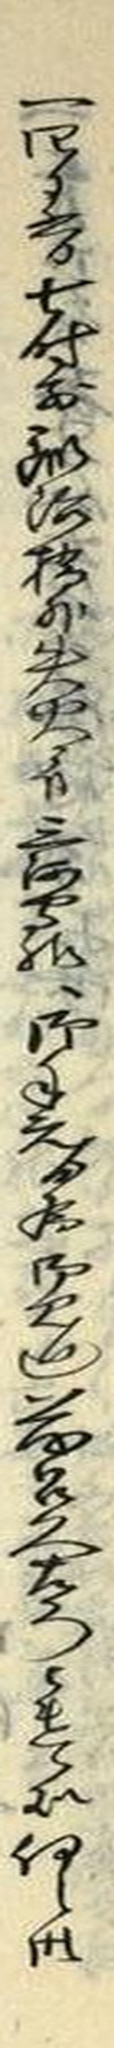一四月六日七時前鍛冶橋外失火ニ付三河守様へ御手元ゟ為御見廻茂呂久左衛門被遣候処何之御
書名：少傅日録抄（斉善付側向頭取日記、在府）
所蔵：福井県文書館 Fukui Prefectural Archives
